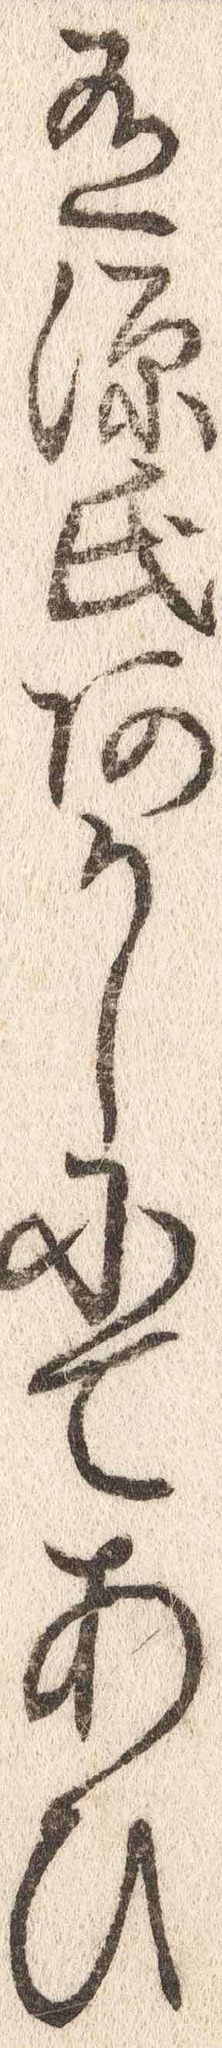有源氏あかしにてあひ
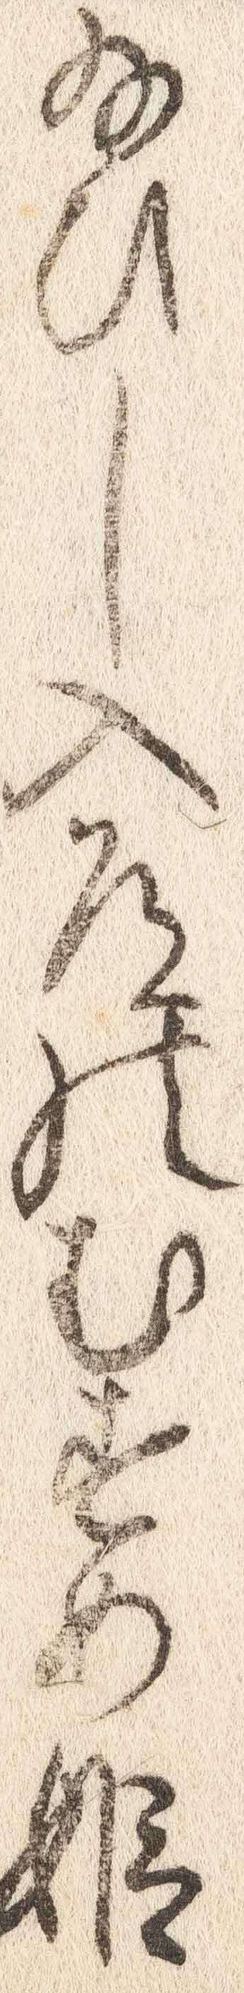給ひし入道のむすめ姫
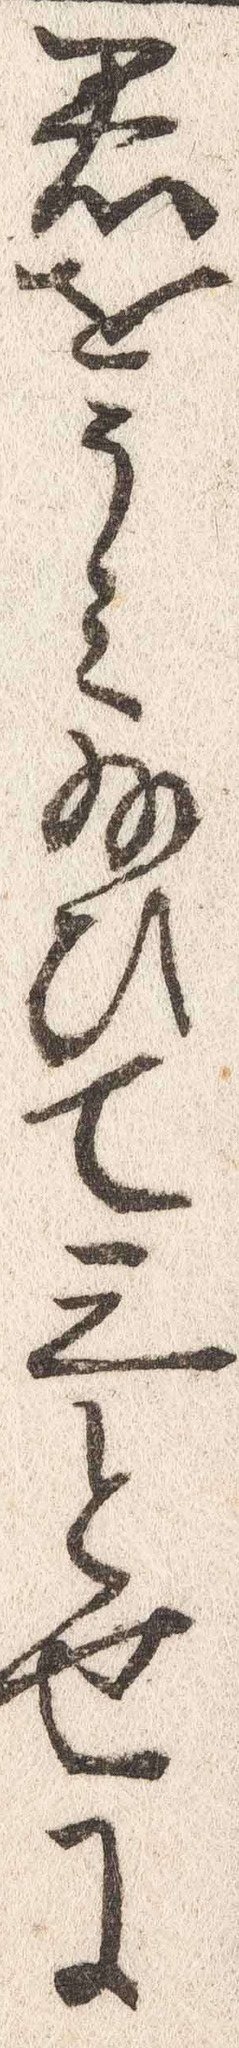君をうみ給ひて三とせに
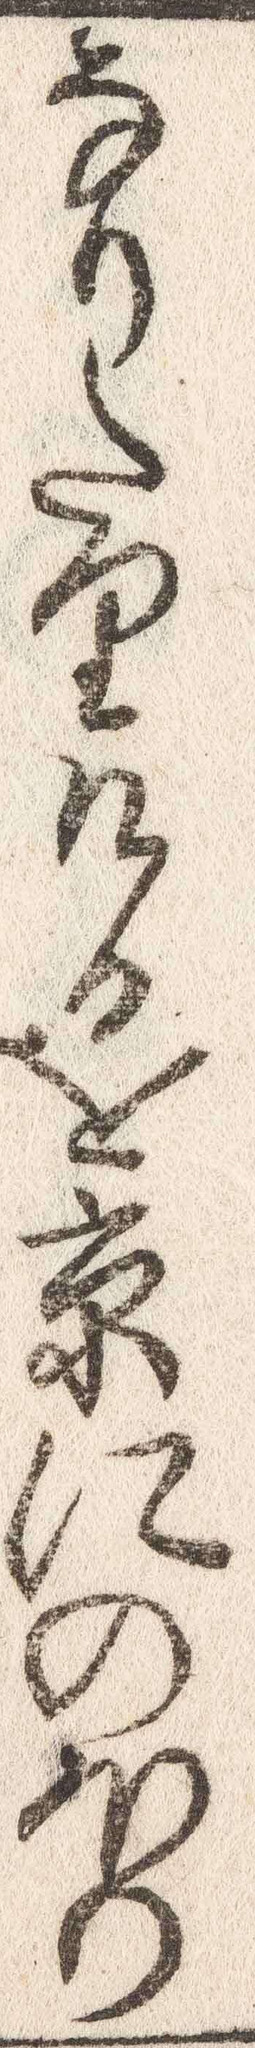なりたりけるを京にのほり
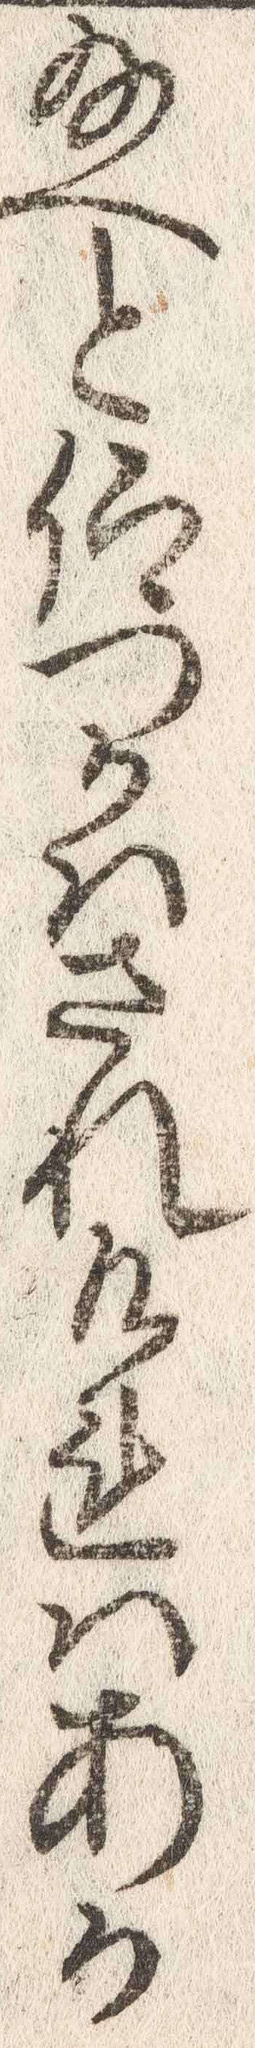給へと仰つかはされけれはあか
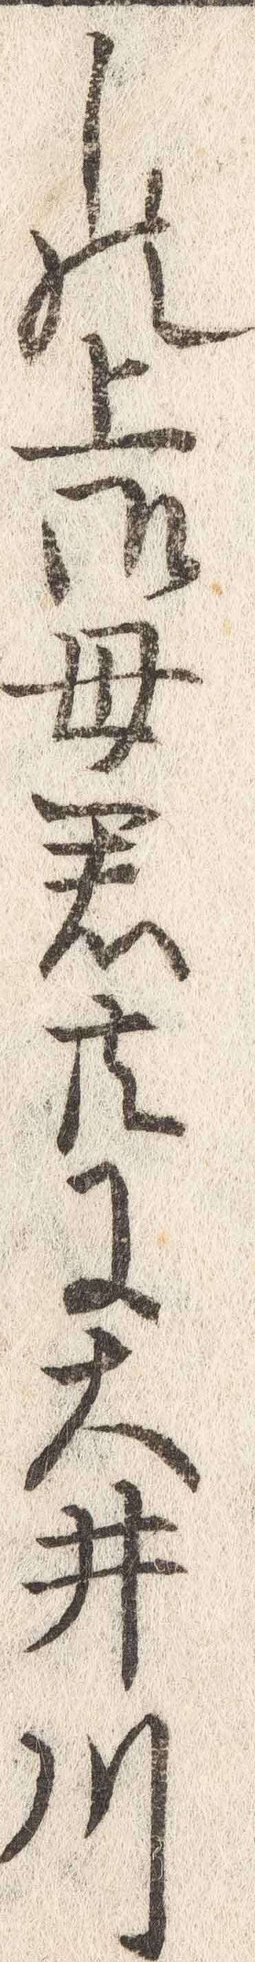しの上御母君共に大井川
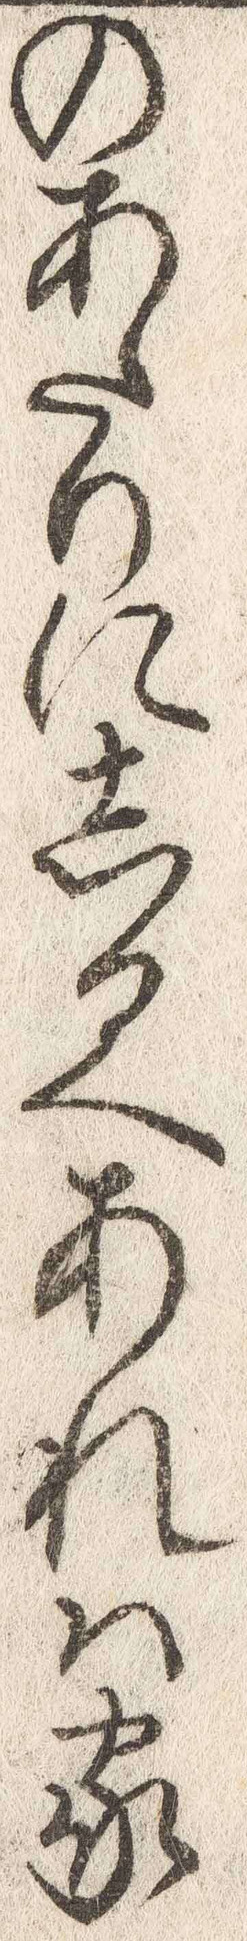のあたりにしるへあれは家

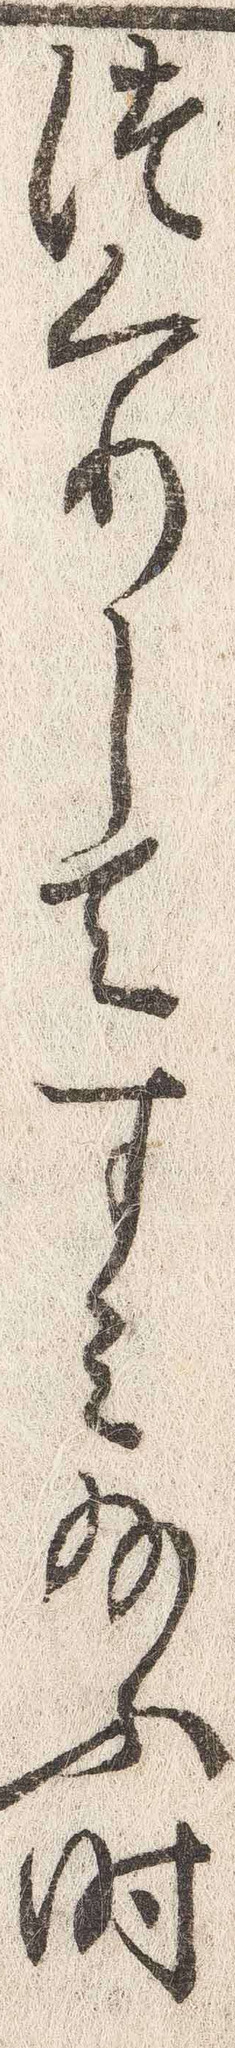つくりしてすみ給ふ時
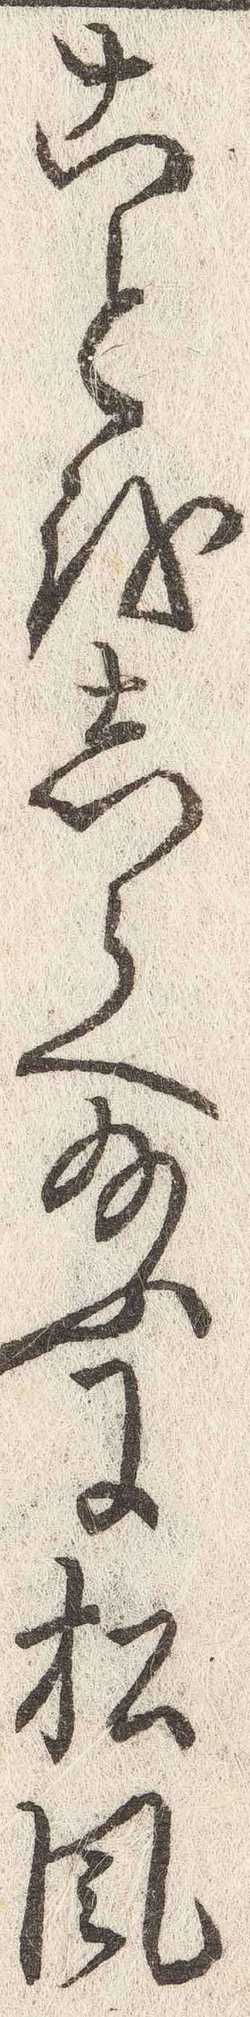ことをしらへ給ふに松風
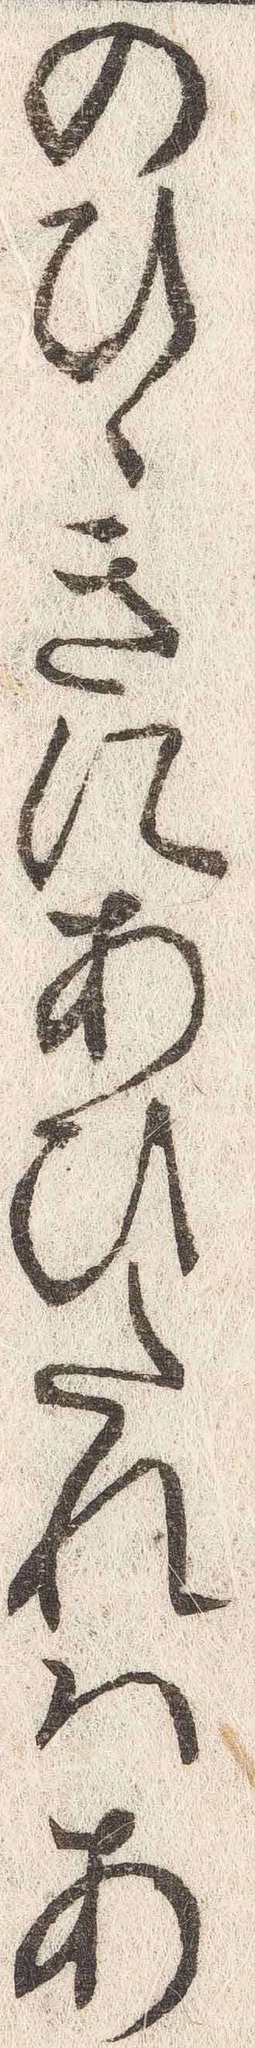のひゝきにあひたれはあ
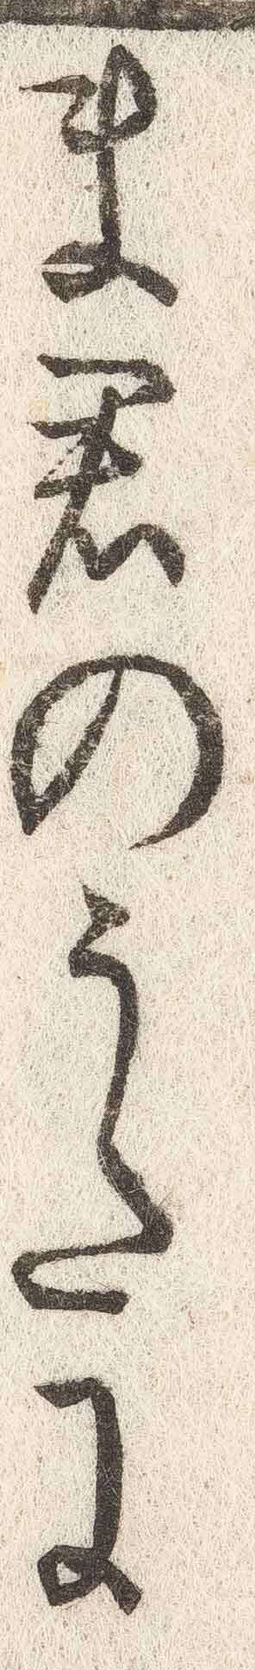ま君のうたに
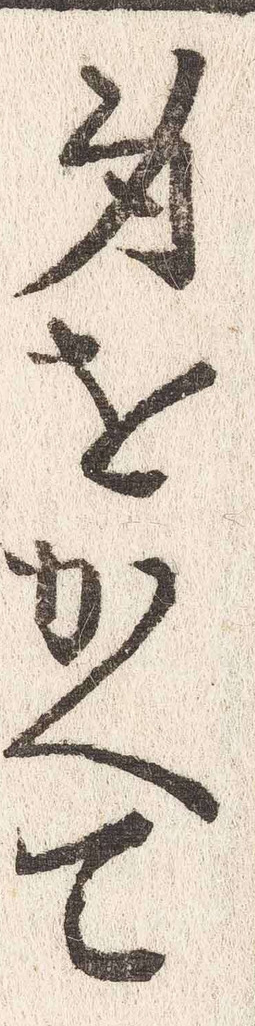身をかへて
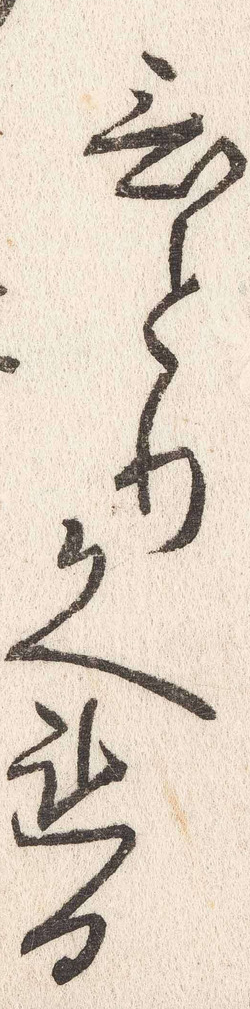ひとりかへれる
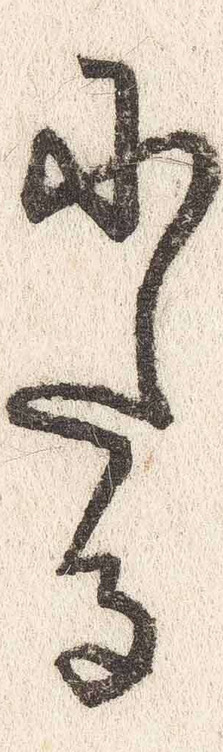にたる
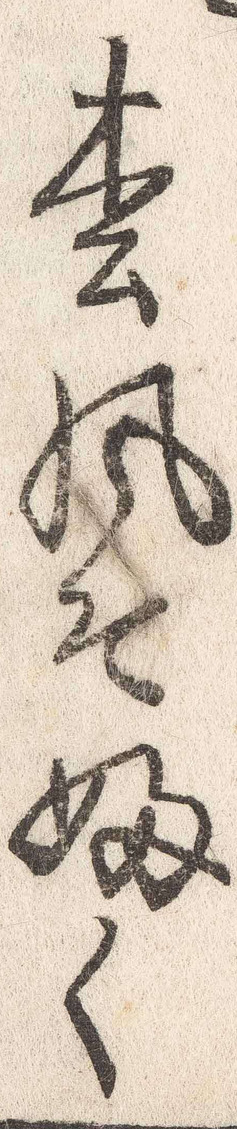松風そふく

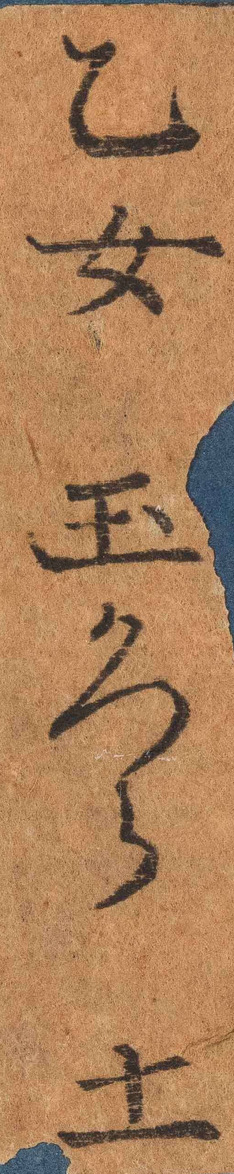乙女玉かつら十一
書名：源氏物語
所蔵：東京学芸大学附属図書館 国文学研究資料館
